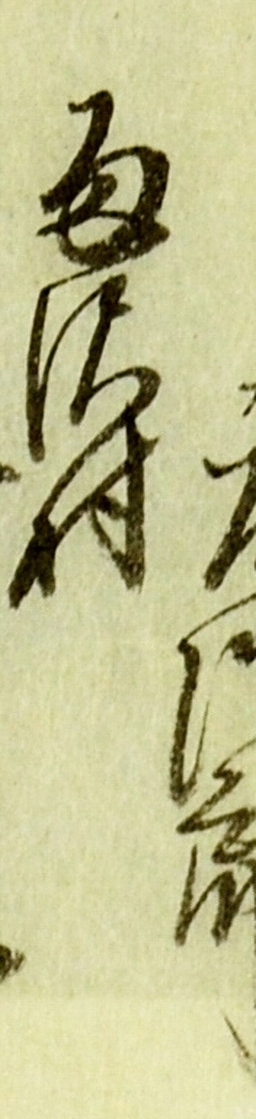雨沢村
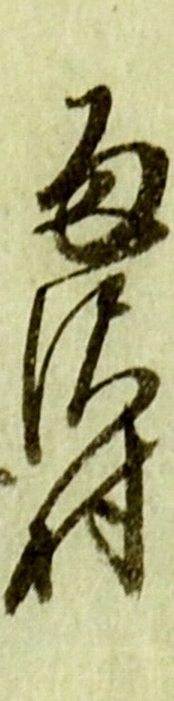雨沢村
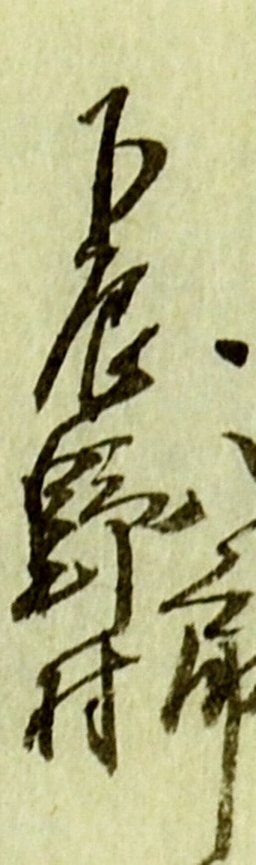下辰野村
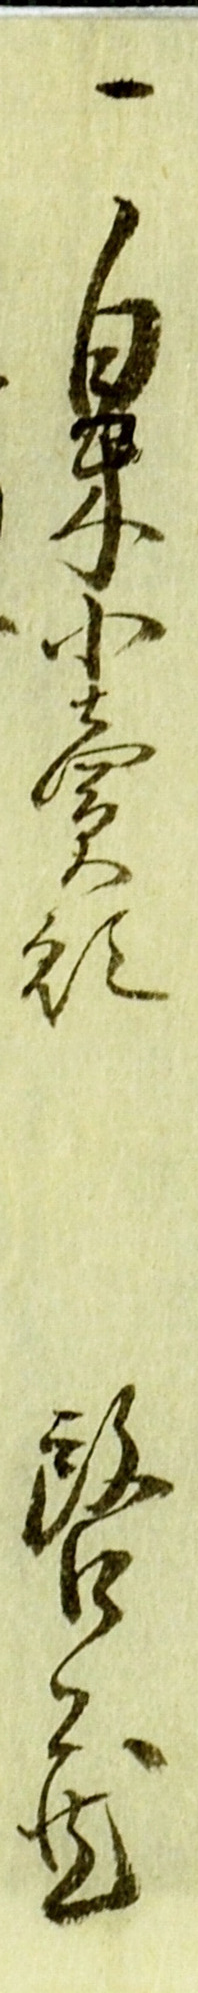一白木小売願啓蔵
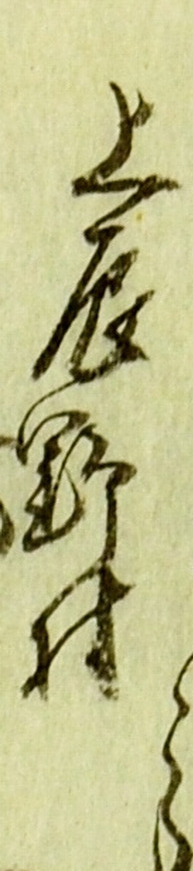上辰野村
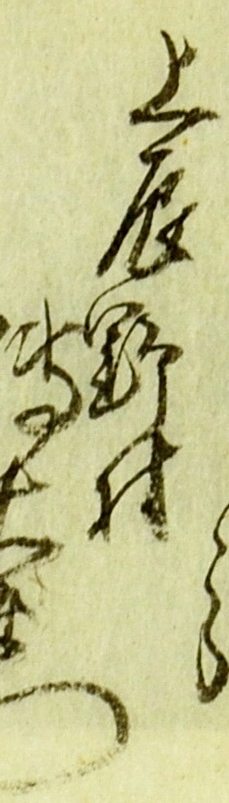上辰野村
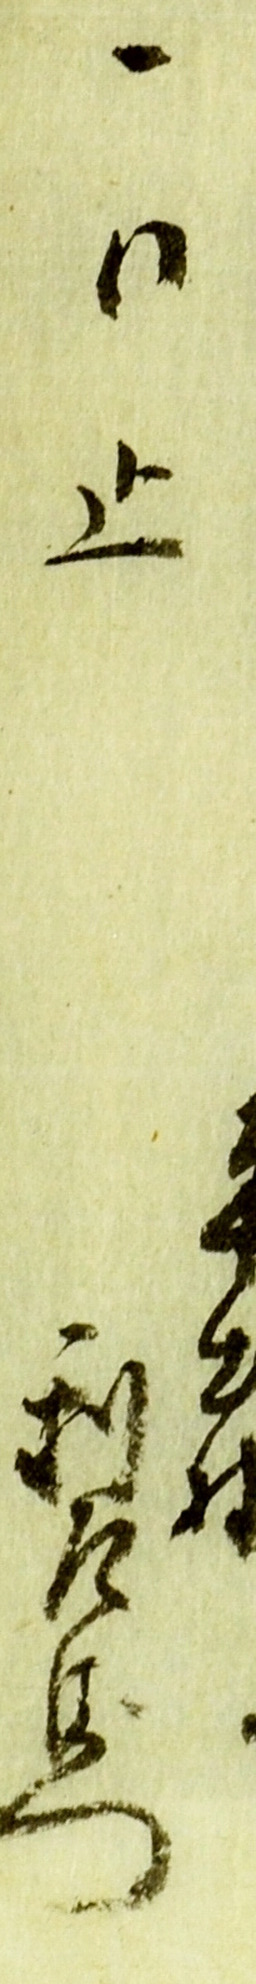一同止利左衛門
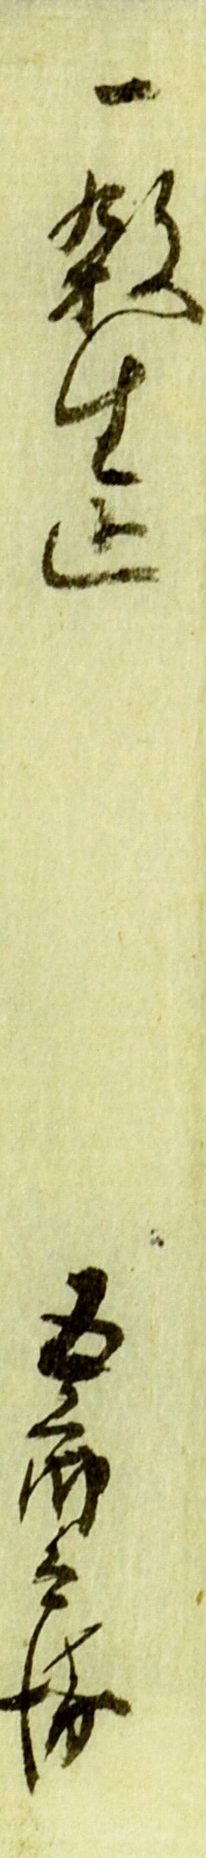一殺生止五郎兵衛
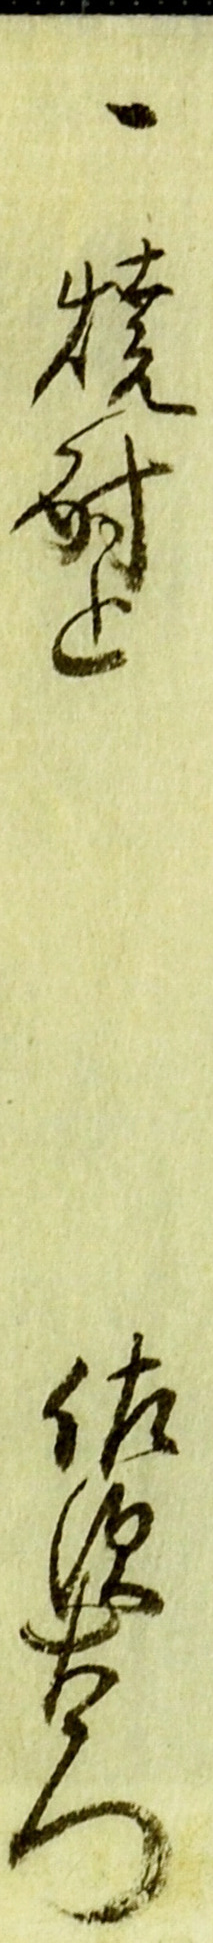一焼酎止佐次右衛門
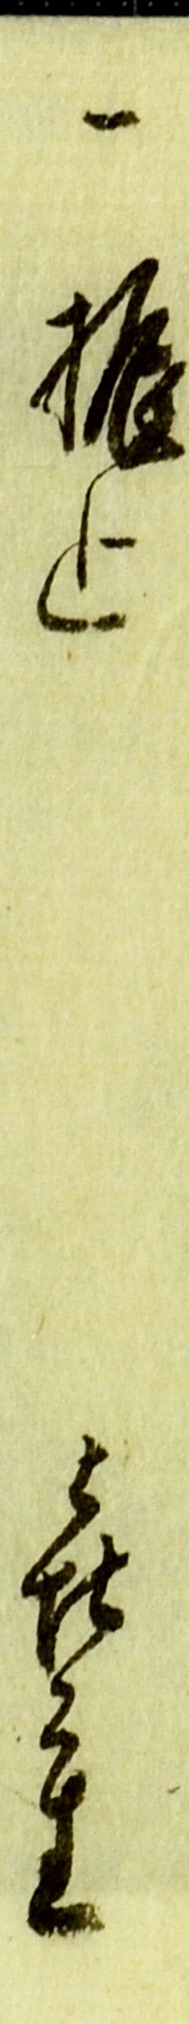一振止嘉重
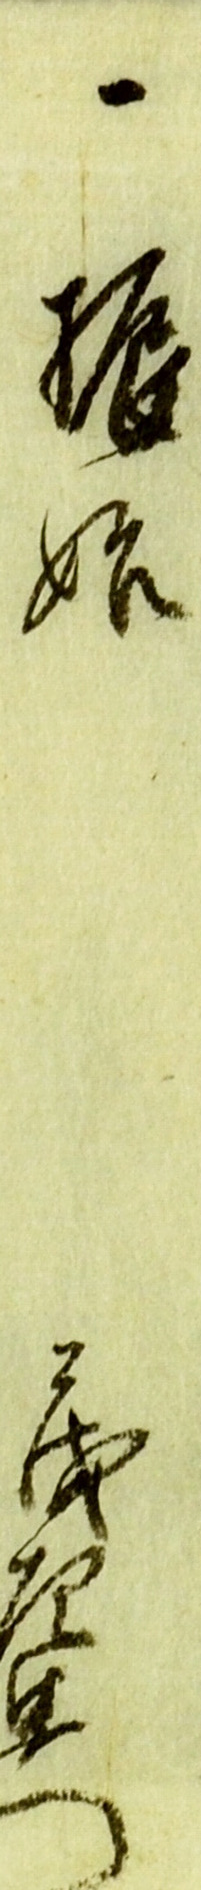一振始茂左衛門
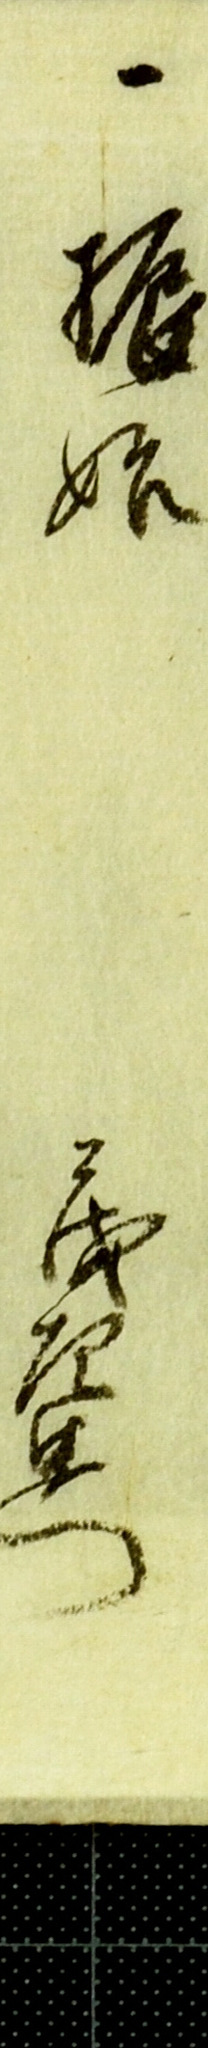一振始茂左衛門
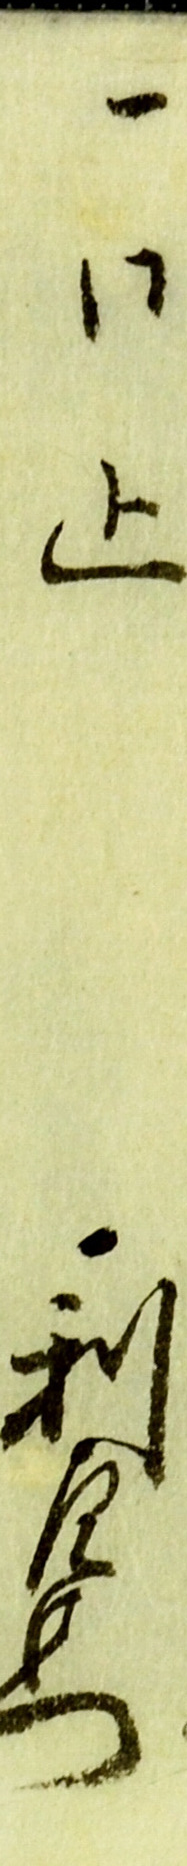一同止利左衛門
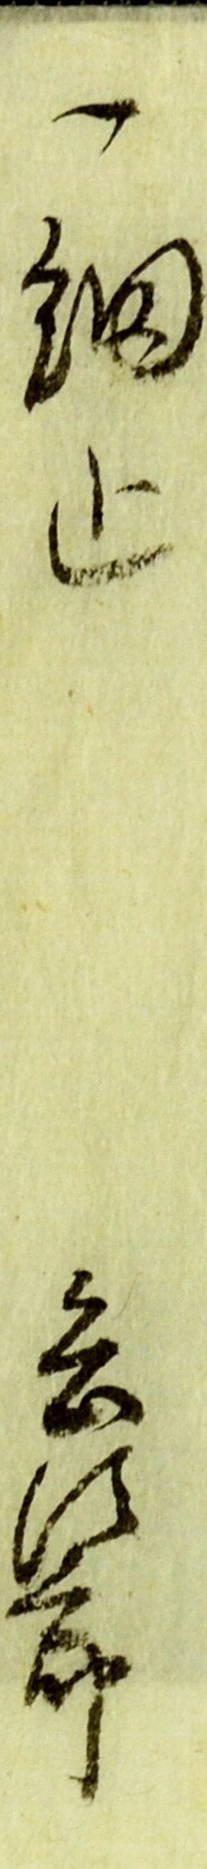一網止兵次郎

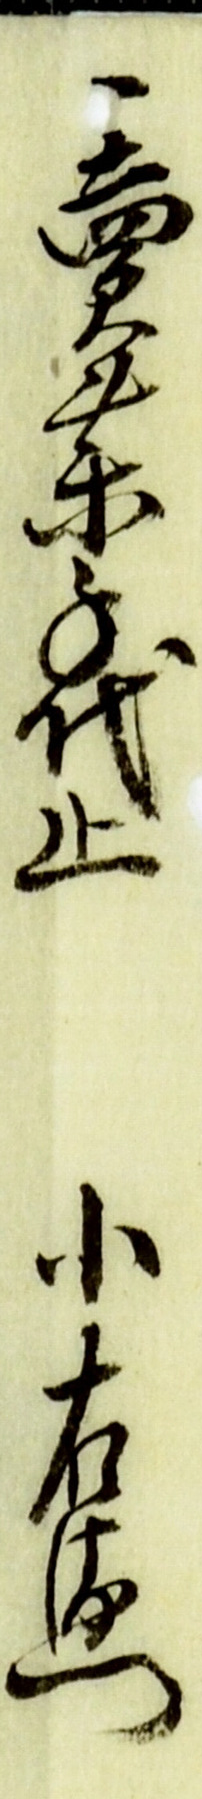一売薬手代止小右衛門
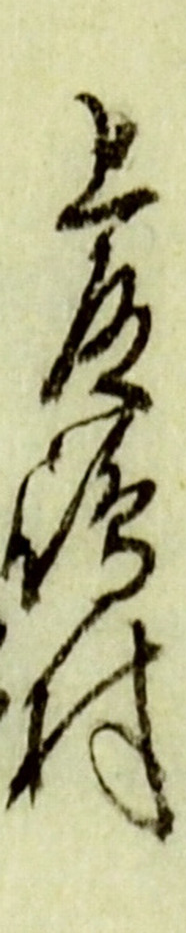上殿嶋村
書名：郷方掛合帳
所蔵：伊那市立高遠町図書館・合同会社AMANE
